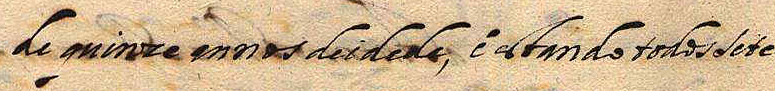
de quinze annos de idade, e estando todos sete
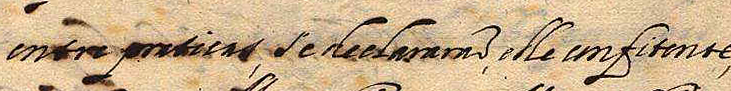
entre praticas, se declararaõ, elle confitente,
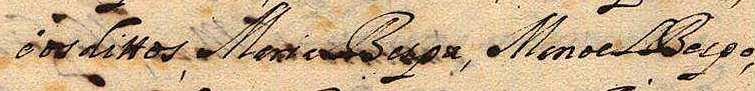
e os dittos, Maria Bispa, Manoel Bispo,
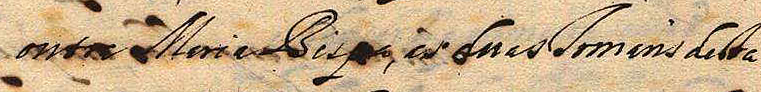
outr_ Maria Bispa, as duas Irmans desta
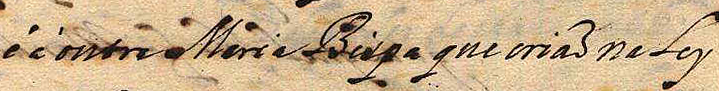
e a outra Maria Bispa que criaõ na Ley
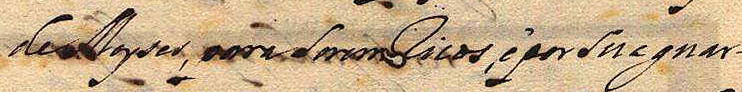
de Moyses, para serem Ricos, e por sua guar
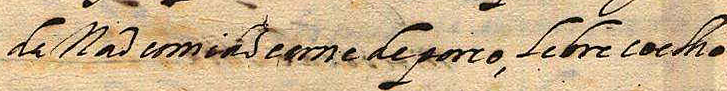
da Naõ comiaõ carne de porco, Lebre coelho
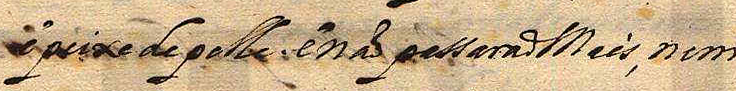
e peixe de pelle, e naõ passaraõ Mais, nem
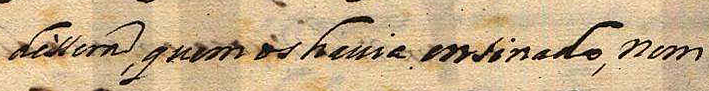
disserā, quem os hauia ensinado, nem
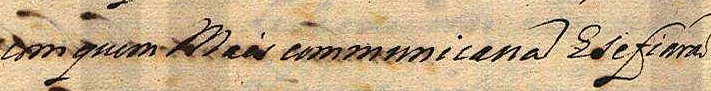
com quem Mais communicauā E se fiaraõ
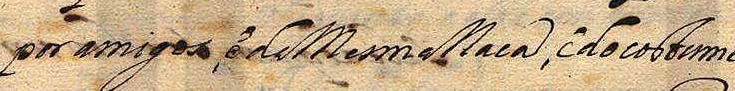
por amigos, e da Mesma Nacā, e do costume
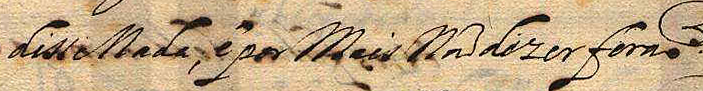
disse Nada, e por Mais Naõ dizer forāo
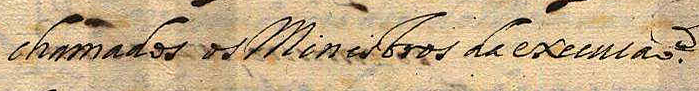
chamados os Ministros da execucaõ.
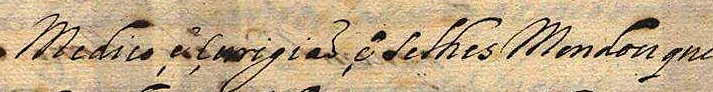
Medico, e çurigiaõ, e se lhes Mandou que
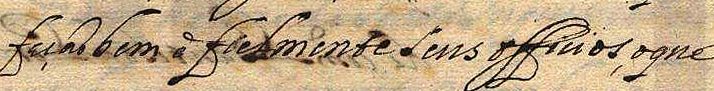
façaõ bem e fielmente seus officios, o que
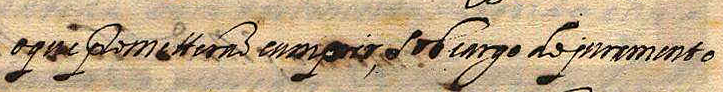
o que prometteraõ cumprir, sob cargo do juramento
